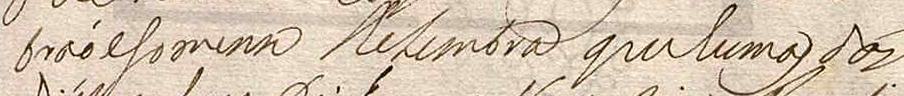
braõ e somente lhe lembra que humas das
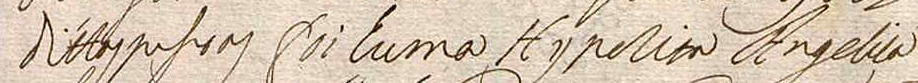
dittas pessoas foi huma Hynezita Angelica
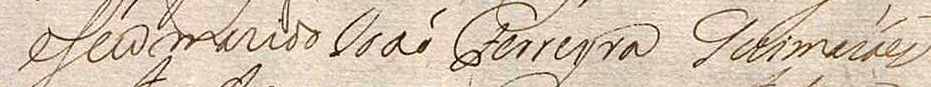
e seu marido Ioaõ Ferreyra Guimarães
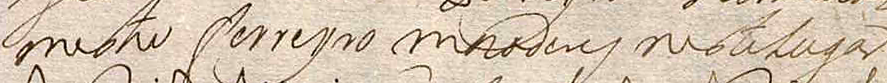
mestre ferreyro moradores neste lugar
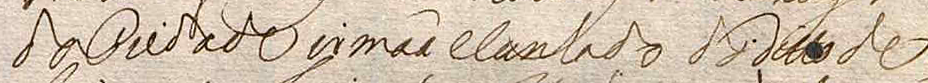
da Piedade irmaã, e cunhado do ditto de
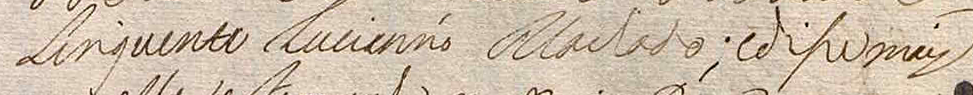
Linquente Lucianno Machado; e disse mais
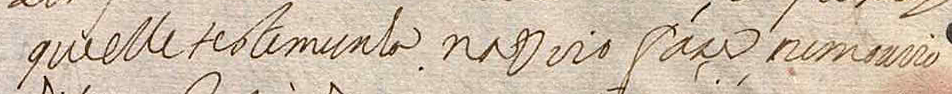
que elle testemunha naõ vio fazer, nem ouvio
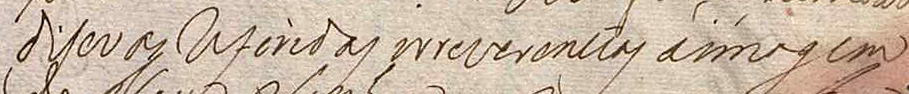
diser as Referidas, irreverencias a imagem
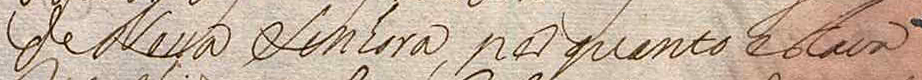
de Nossa Senhora, porquanto estava
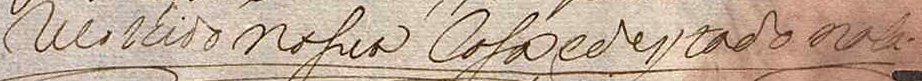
Recolhido na sua Casa, e deytado na ca
